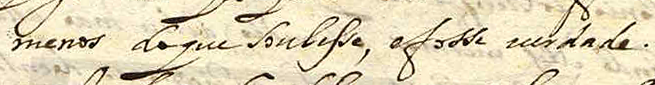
menos do que soubesse, e fosse uerdade.
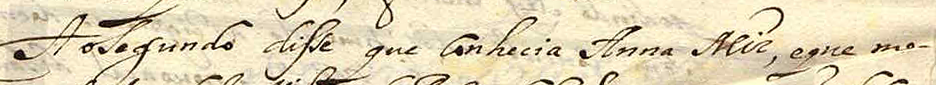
Ao Segundo disse que conhecia Anna Miz̄, e que mo
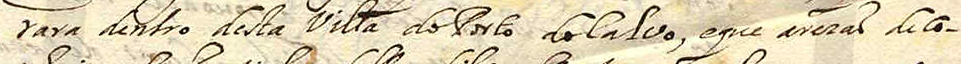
rara dentro desta Villa do Porto do Calvo, e que a rezaõ de co
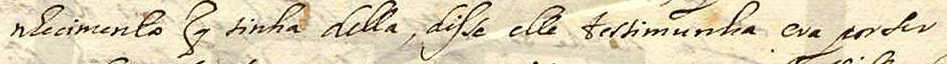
nhecimento q̄ tinha della, disse elle testimunha era por ser
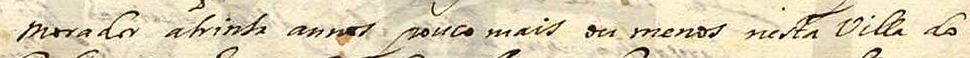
morador a trinta annos pouco mais ou menos nesta Villa do
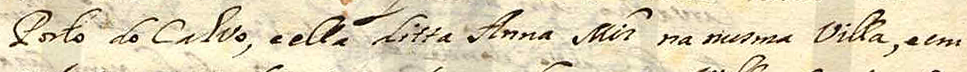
Porto do Calvo, e ella ditta Anna Miz̄ na mesma Villa, e em
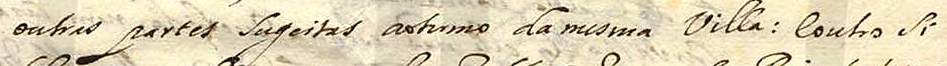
outras partes sugeitas ao termo da mesma Villa: E outroSi
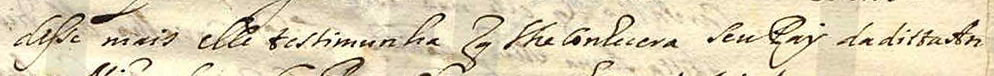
disse mais elle testimunha q̄ lhe conhecera seu Pay da ditta An
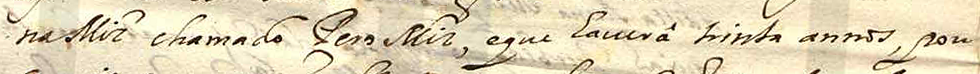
na Miz̄ chamado Pero Miz̄, e que hauerá trinta annos, pou
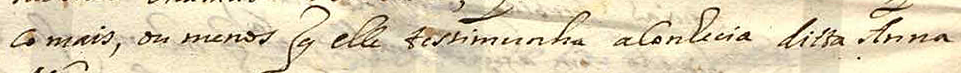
co mais, ou menos q̄ elle testimunha a Conhecia ditta Anna
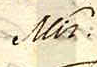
Miz̄.
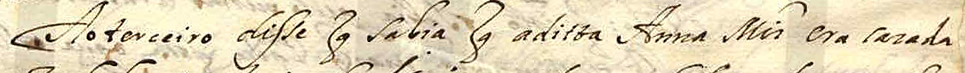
Ao terceiro disse q̄ sabia q̄ a ditta Anna Miz̄ era cazada
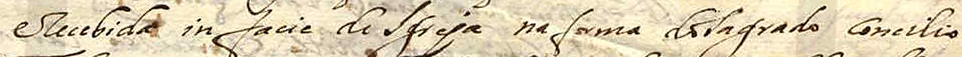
e Recebida in facie de Igreja na forma do sagrado concilio
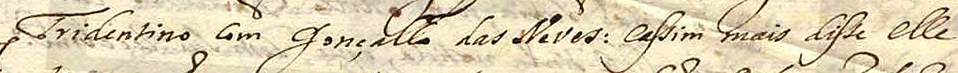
Tridentino com Gonçallo das Neves: e assim mais disse elle
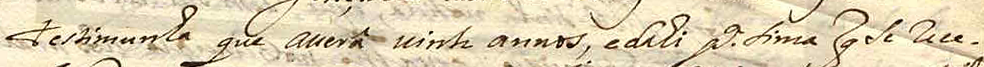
testimunha que auerá uinte annos, e dahi p.a sima q̄ se Rece
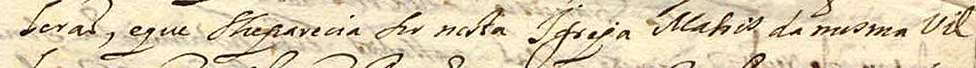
beraõ, e que lhe parecia ser nesta Igreja Matris da mesma Vil
